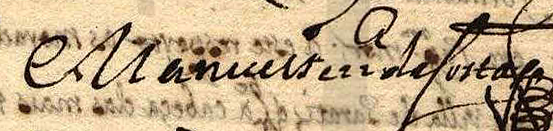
Manuel terr.a da Costa
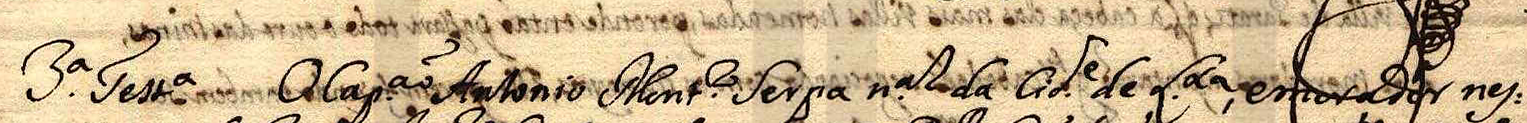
3.a Testa. O Cap.aõ Antonio Mont.ro Serpa n.al da Cid.e de L.xa, e morador nes
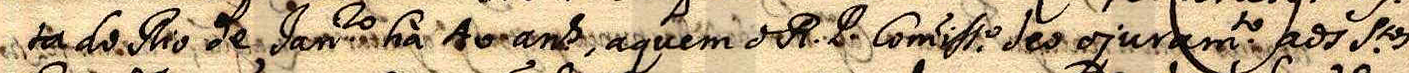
ta do Rio de Ian.ro ha 40 an.s, a quem o R. P. Com̄iss.o deo o juram.to aos S.tos
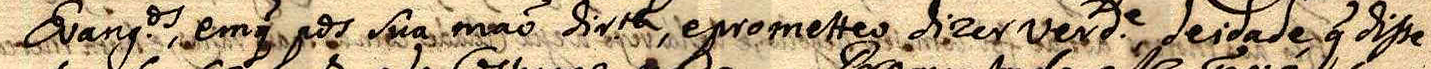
Evang.os, em q̄ pos sua maõ dir.ta, e prometteo dizer verd̄.e, de idade, q̄ disse
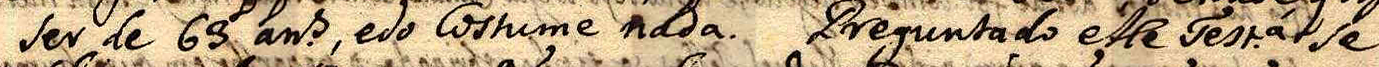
ser de 63 an.s, e do Costume nada. Preguntado elle Test.a se
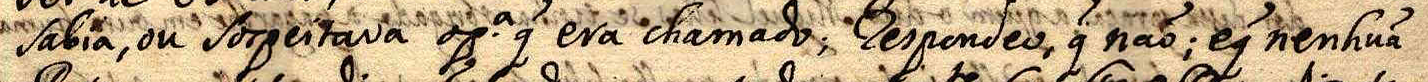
sabia, ou sospeitava o p.a q̄ era chamado; Respondeo, q̄ naõ; e q̄ nenhuā
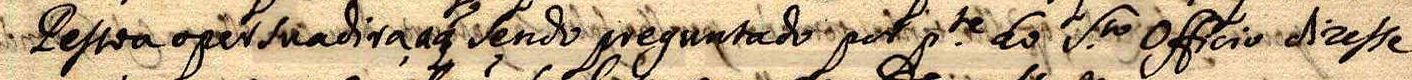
Pessoa o persuadira a q̄ sendo preguntado por p.te do S.to Officio dizesse
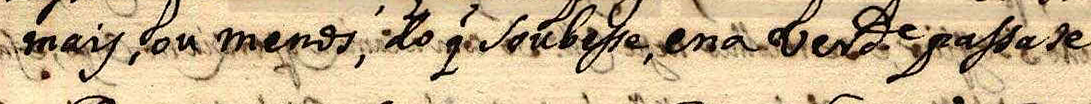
mais, ou menos, do q̄ soubesse, e na verd.e passase
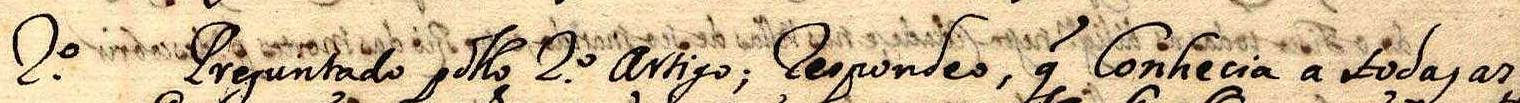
2.o Preguntado pello 2.o artigo; Respondeo, q̄ Conhecia a todas as
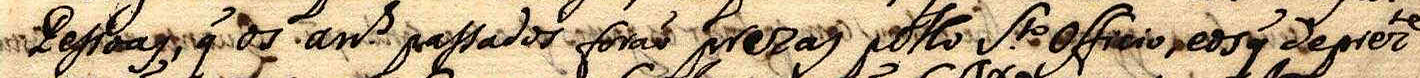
Pessoas, q̄ os an.s passados foraõ prezas pello S.to officio, e os q̄ de prezte
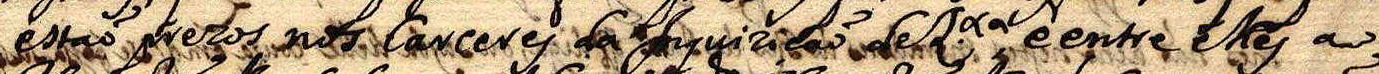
estaõ prezos nos Carceres da Jnquiziçaõ de L.xa, e entre elles a
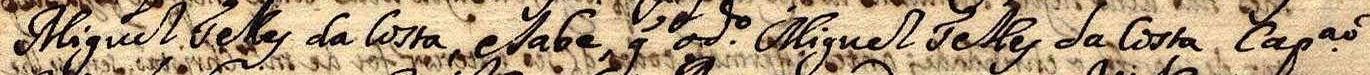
Miguel Telles da Costa, e sabe, q̄ o d.o Miguel Telles da Costa Cap.aõ
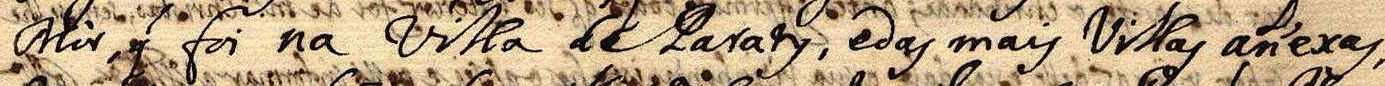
Mor, q̄ foi na Villa de Paraty, e das mais Villas anexas,
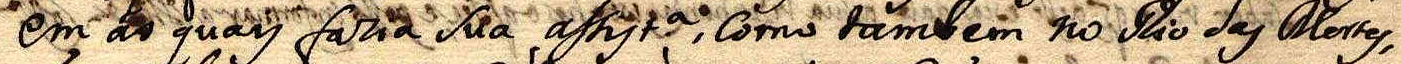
em as quais fazia sua assist.a, como tambem no Rio das Mortes,
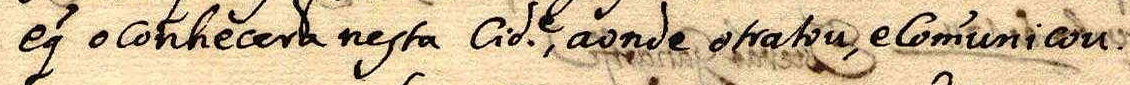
e q̄ o conhecera nesta Cid.e, aonde o tratou, e Com̄unicou
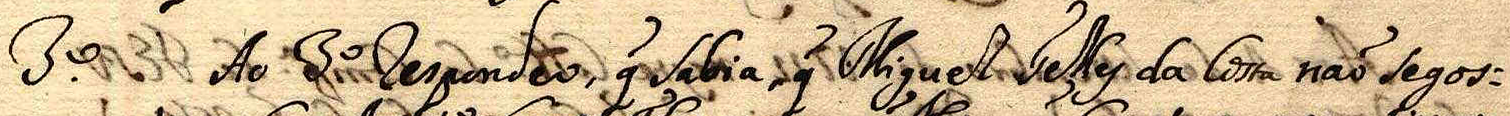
3.o Ao 3.o Respondeo, q̄ sabia, q̄ Miguel Telles da Costa naõ se gos
